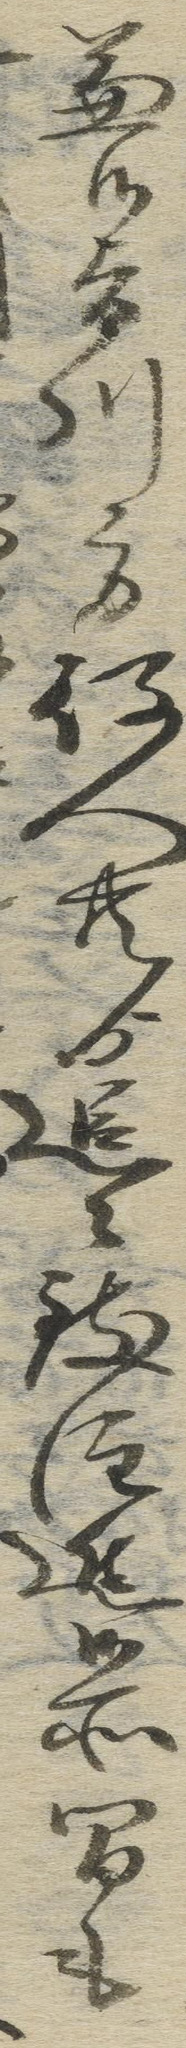兼候旨川方役人共ゟ追々致注進候所間も
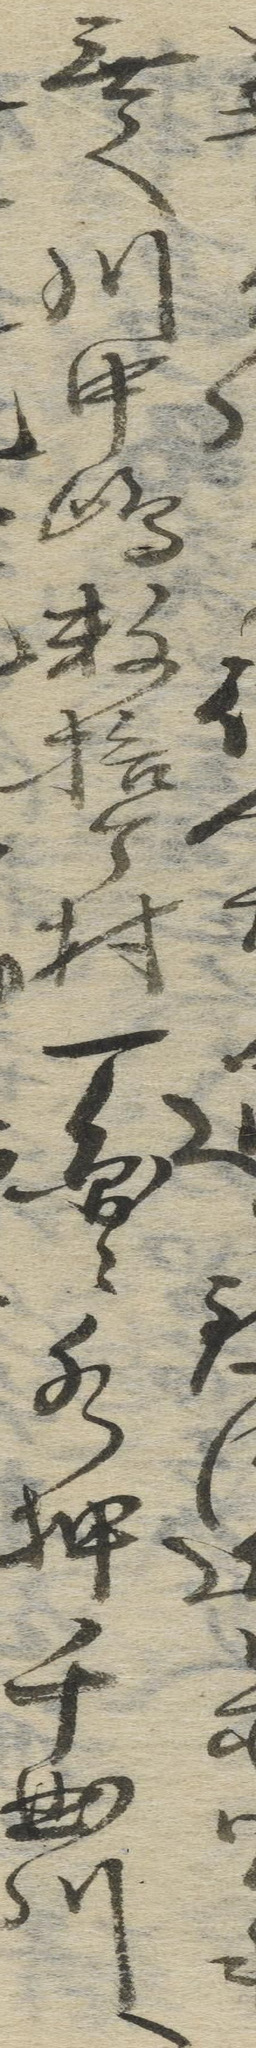無く川中島数拾ヶ村一圓二水押千曲川へ
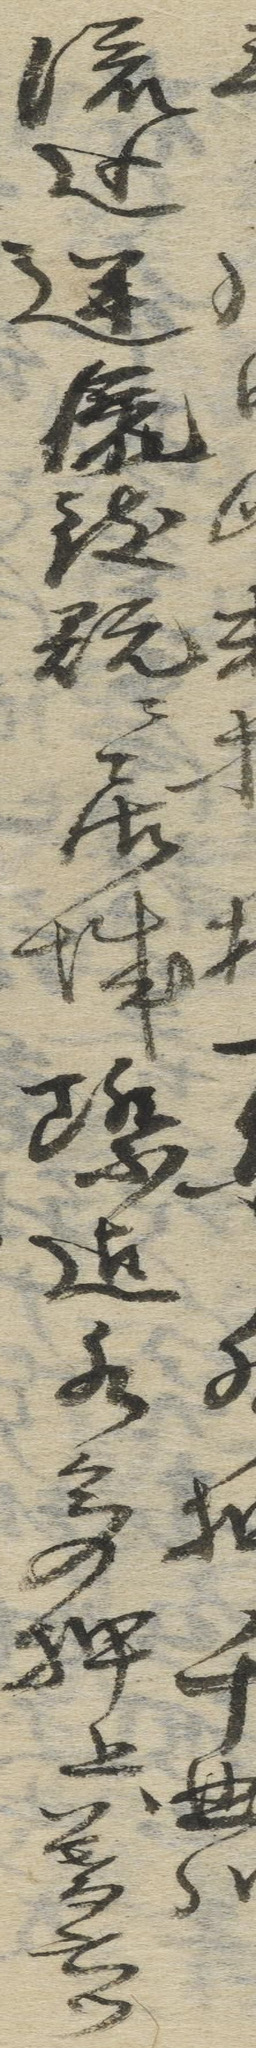流込逆流致既二居城際迄水多押上暮六ッ
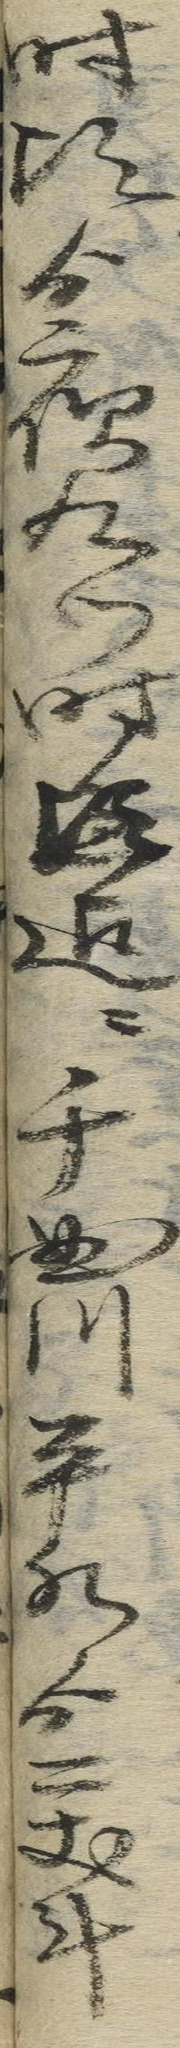時頃ゟ夜九ッ時頃迄二千曲川平水ゟ二丈計
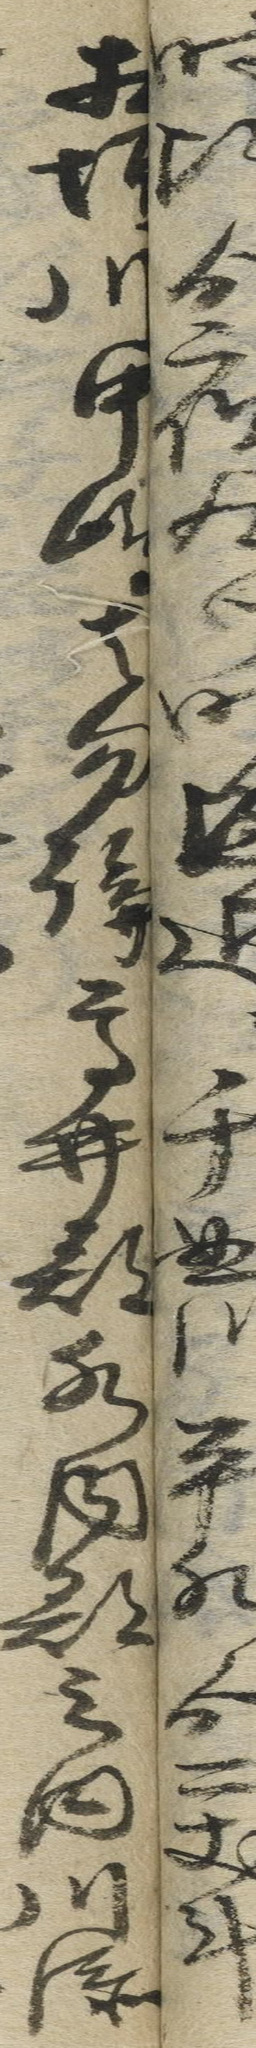相増川中嶋は勿論高井郡水内郡之内川添
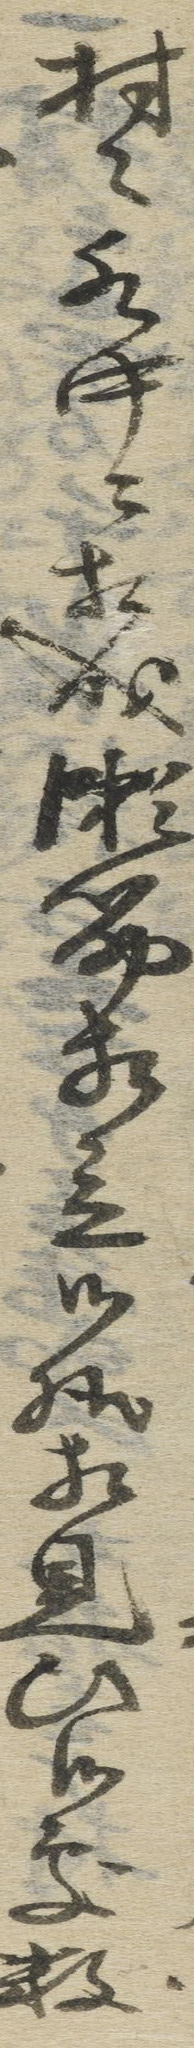村々水中二相成瀬筋相立候様相見ひ候処数
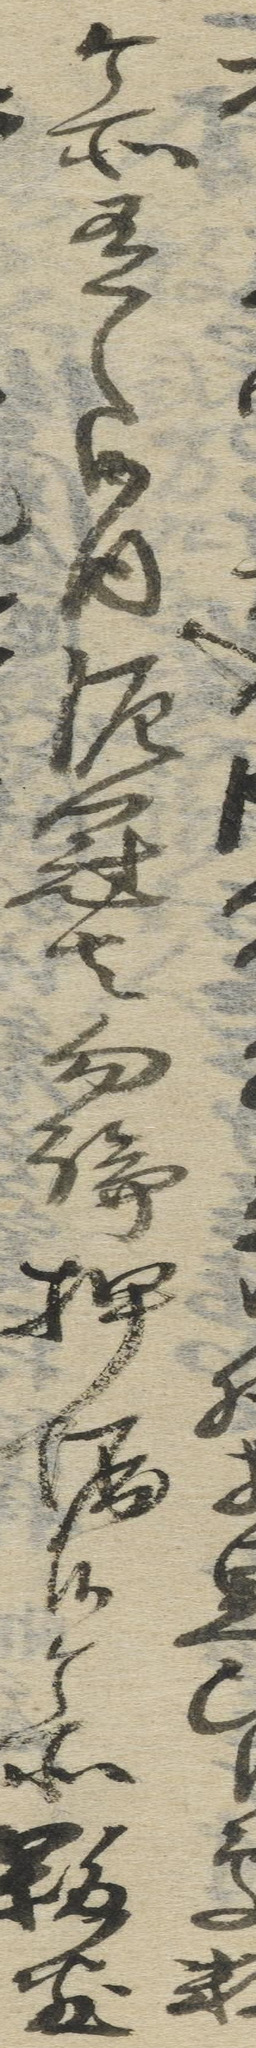ヶ所有之候内泥冠は勿論押堀候ヶ所夥敷
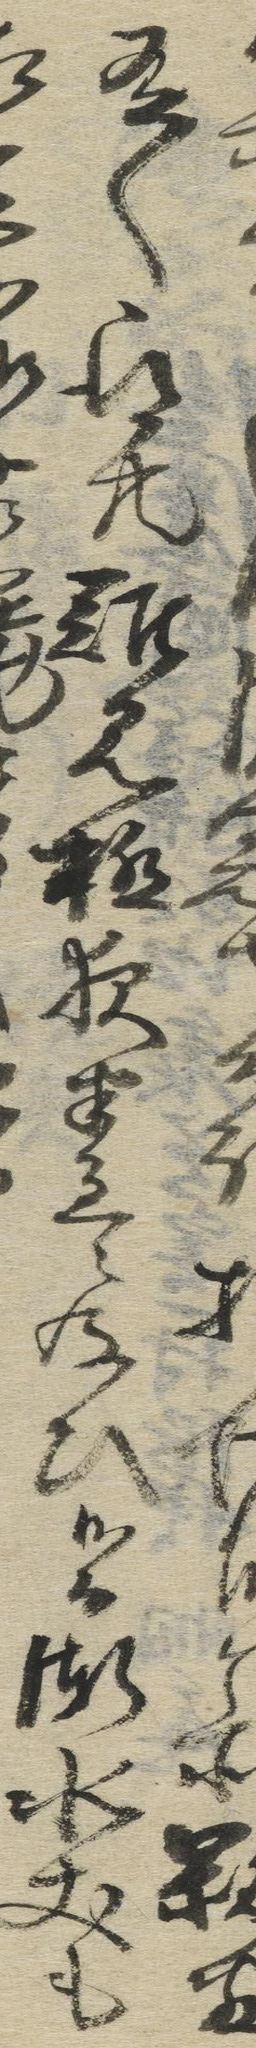有之候得共難見極夜半過二及ひ候而漸水丈も
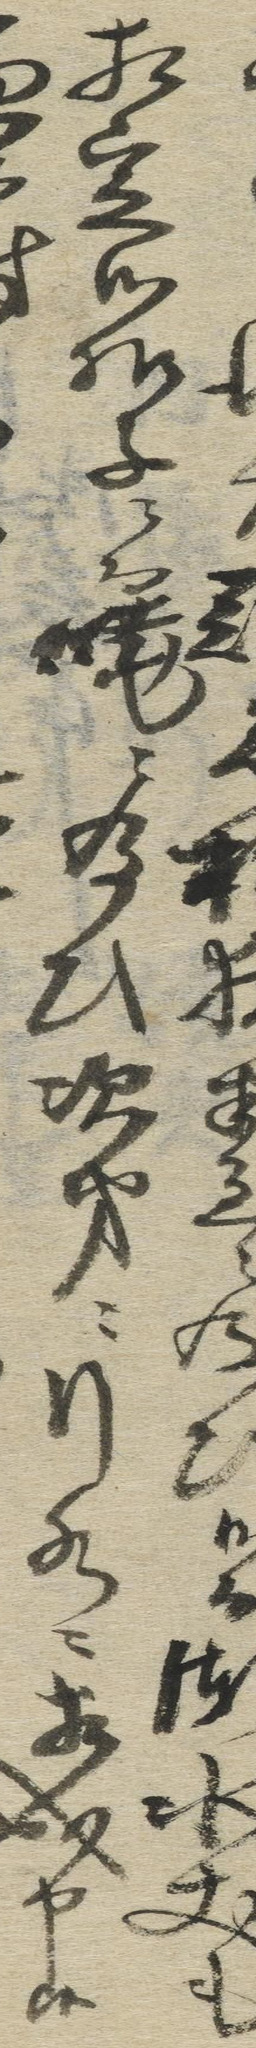相定候様子二而暁二及ひ次第二引水二相成申候
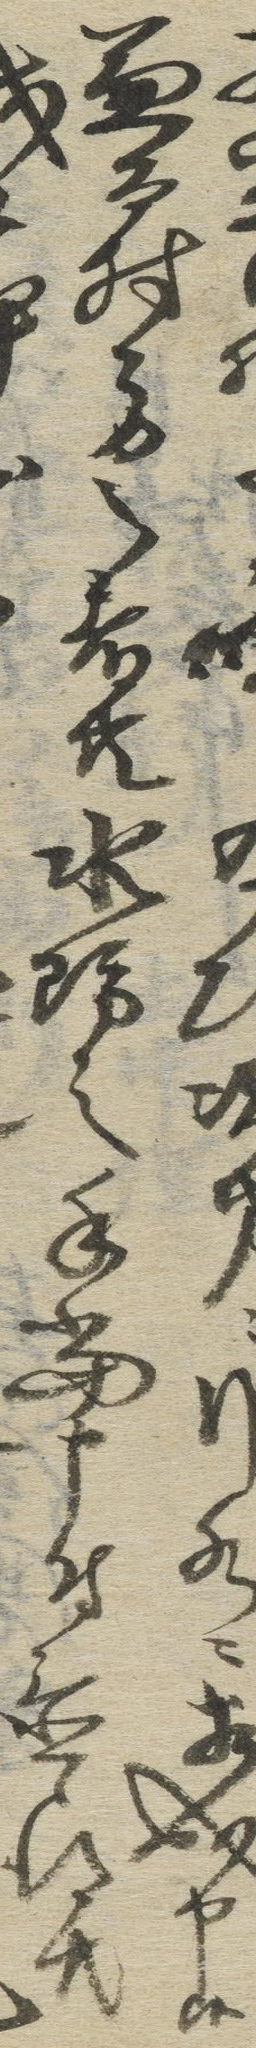兼而村方之者共水防之手当申付置候得共
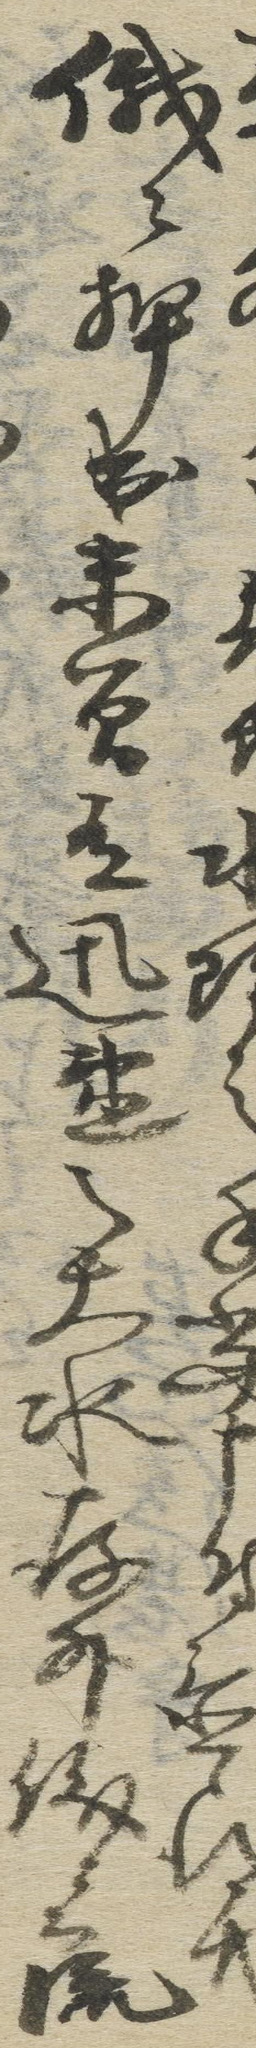俄二押出未曾有迅速之大水存外儀二而流
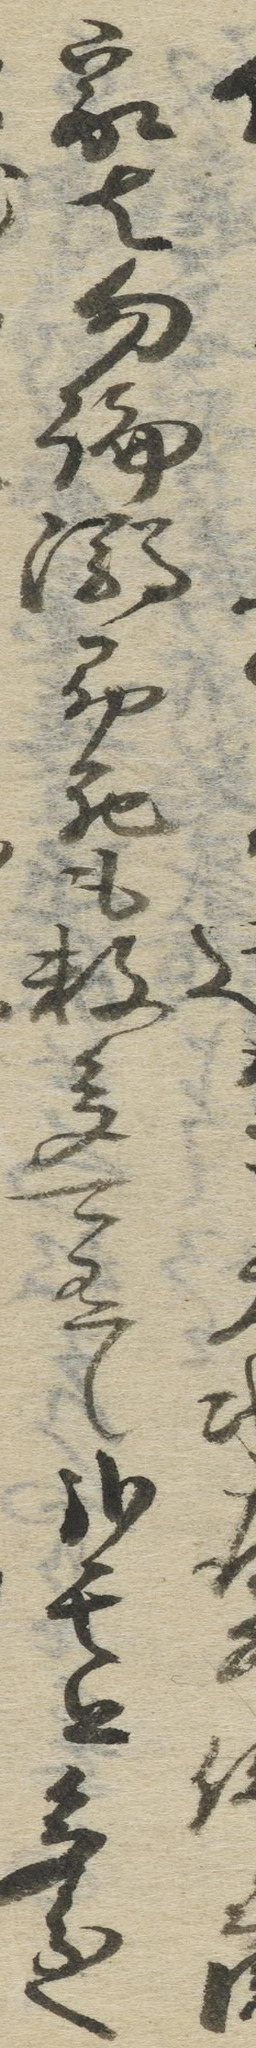家は勿論溺即死も数多可有之候哉其上多分之
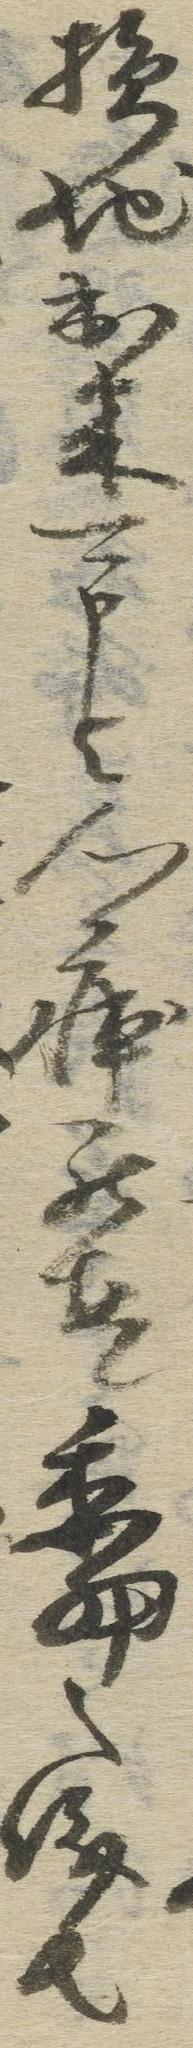損地出来可申と心痛罷在候委細之儀は
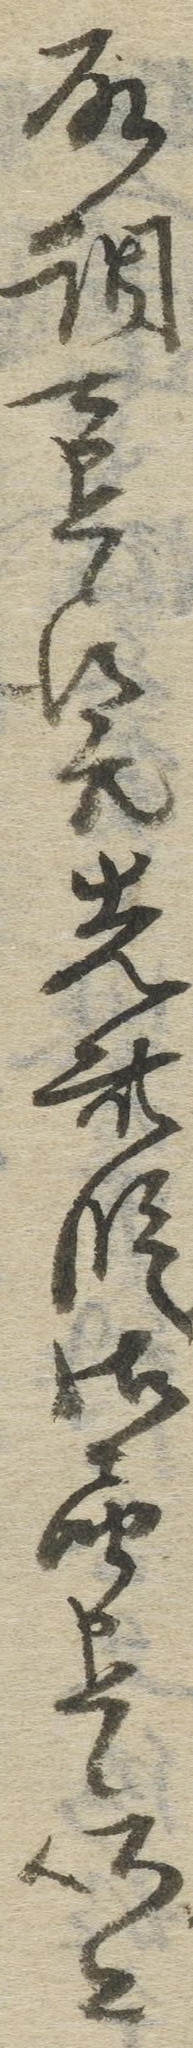取調可申上候得共先此段御届申上候以上
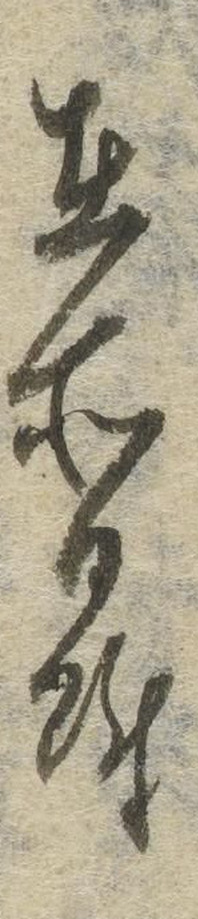在所日附

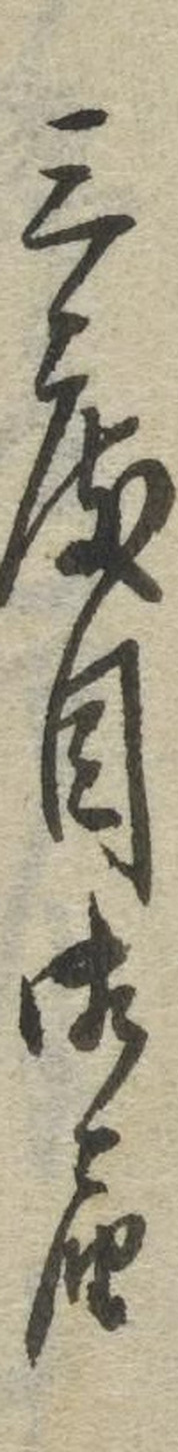三度目御届
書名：信濃越後　地震書留
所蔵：東京大学地震研究所図書室 Earthquake Research Institute Library, The University of Tokyo, JAPAN
